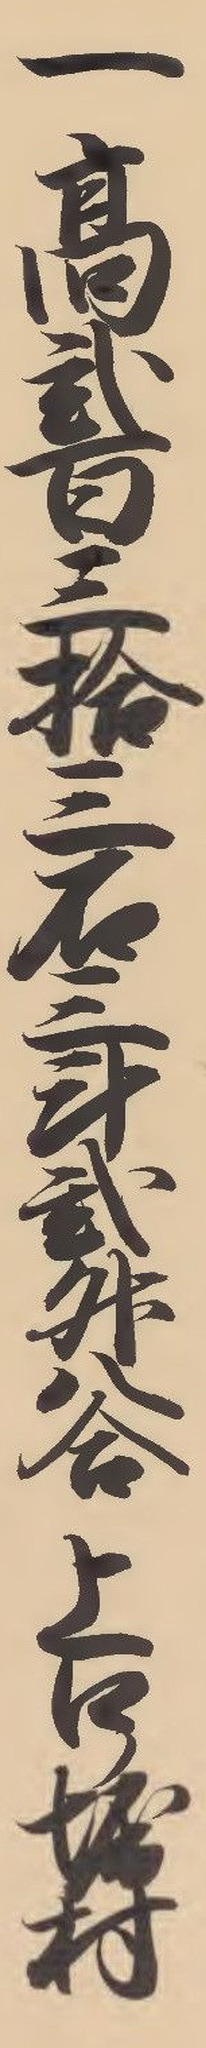一高弐百三拾三石三斗弐升八合上口堀村
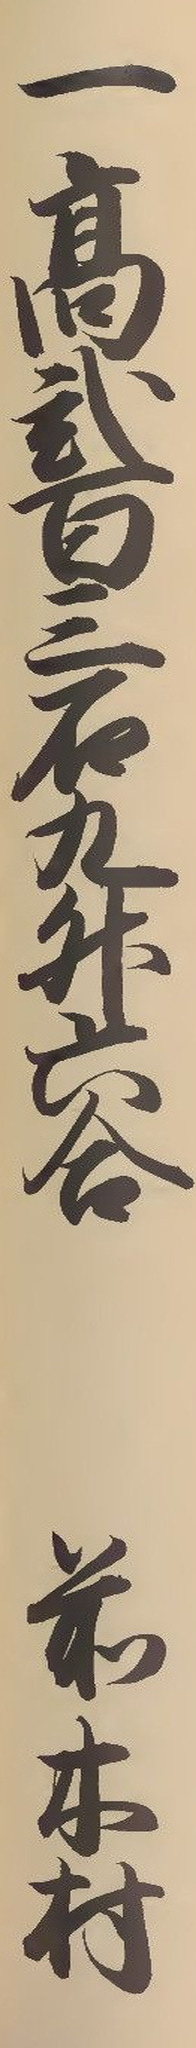一高弐百三石九升六合前木村
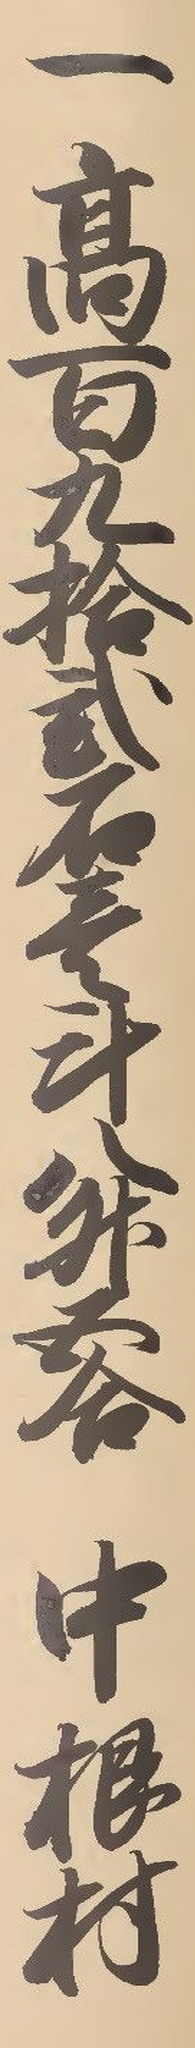一高百九拾弐石壱斗八升五合中根村
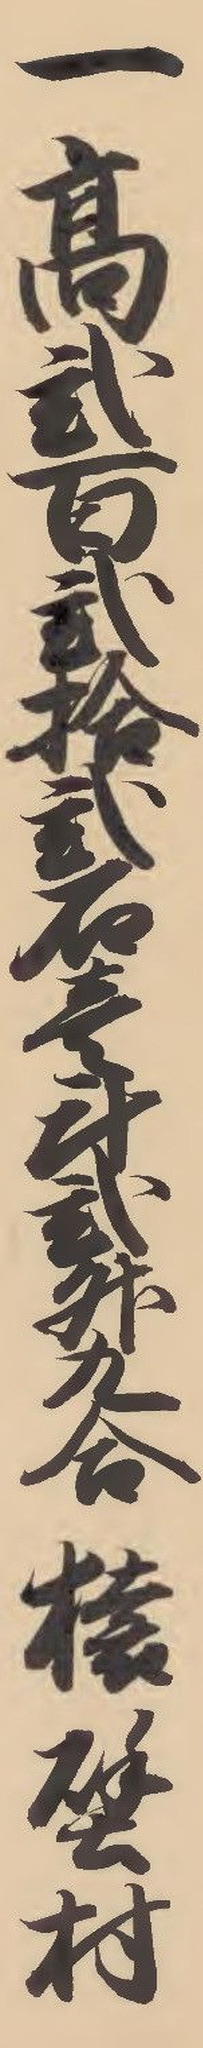一高弐百弐拾弐石壱斗弐升九合猿壁村
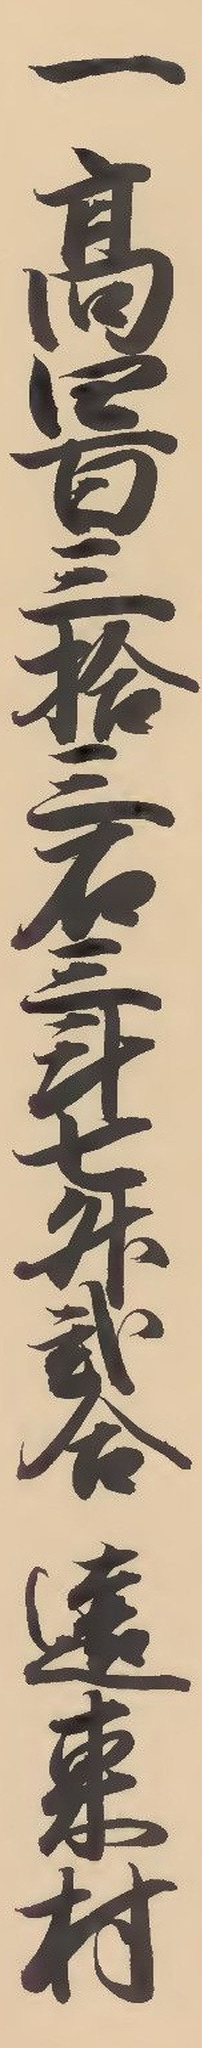一高四百三拾三石三斗七升弐合遠東村
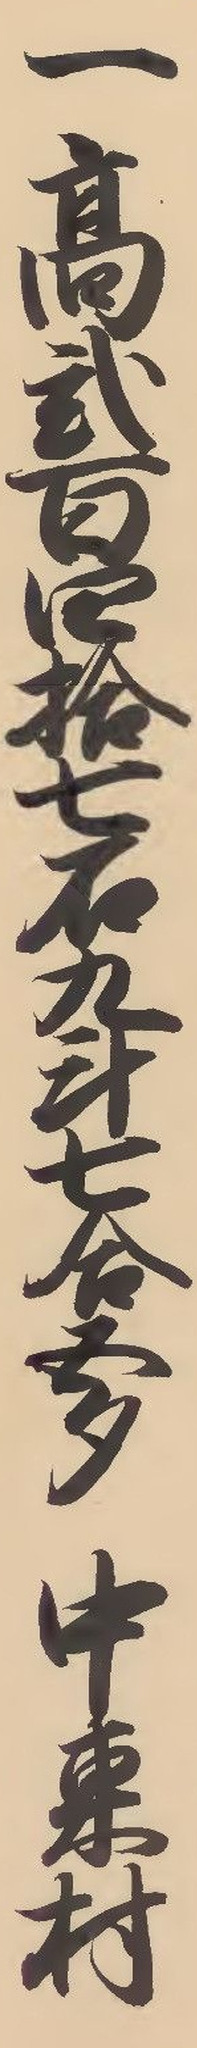一高弐百四拾七石九斗七合五勺中東村

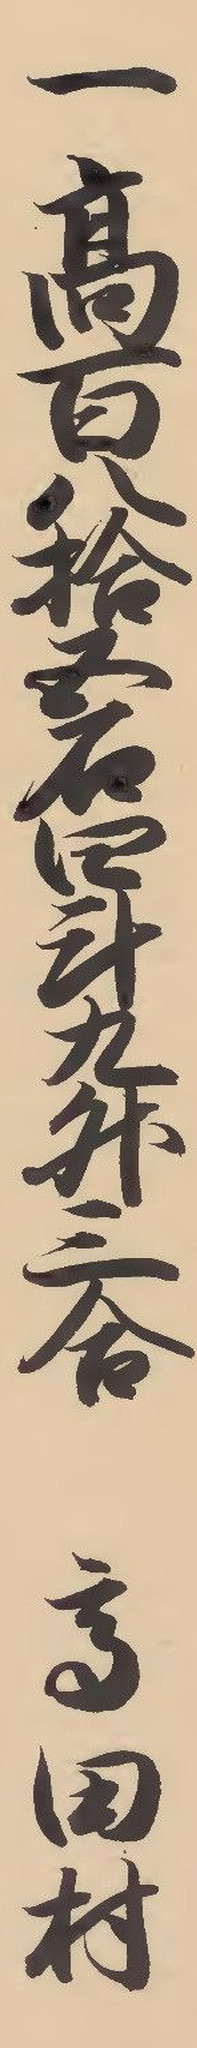一高百八拾五石四斗九升三合高田村
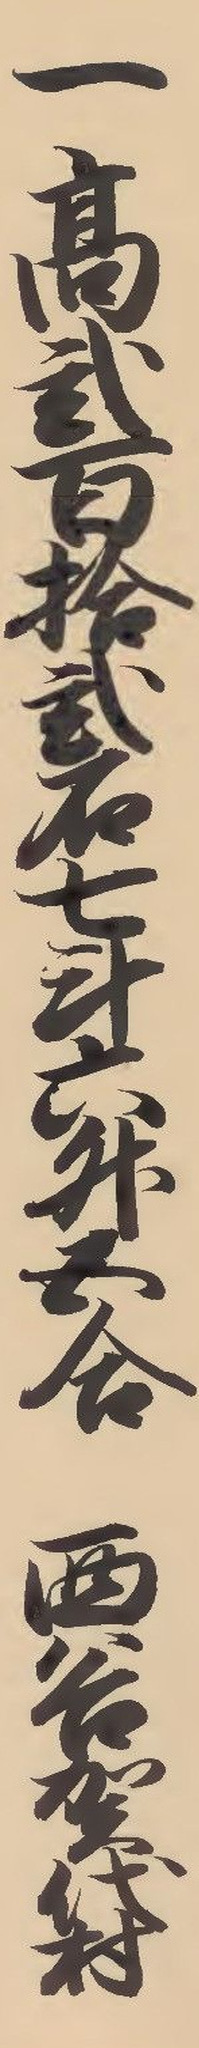一高弐百拾弐石七斗六升五合西谷賀代村
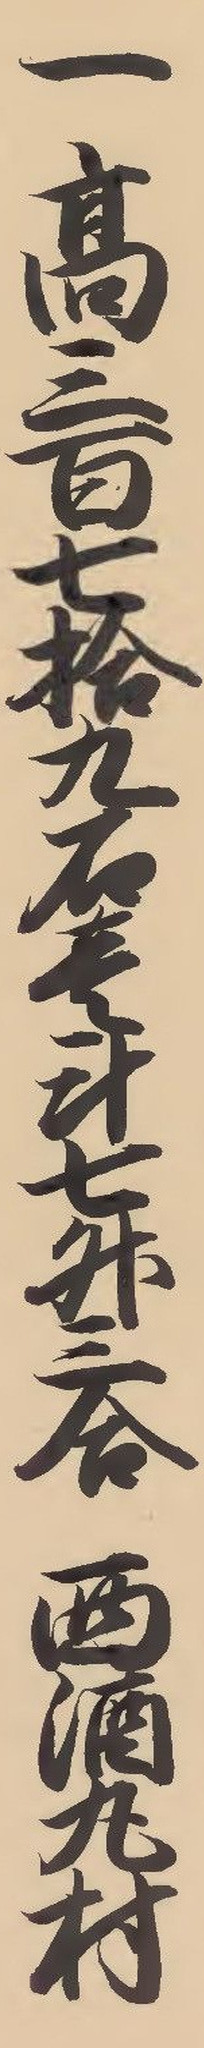一高三百七拾九石壱斗七升三合西酒丸村
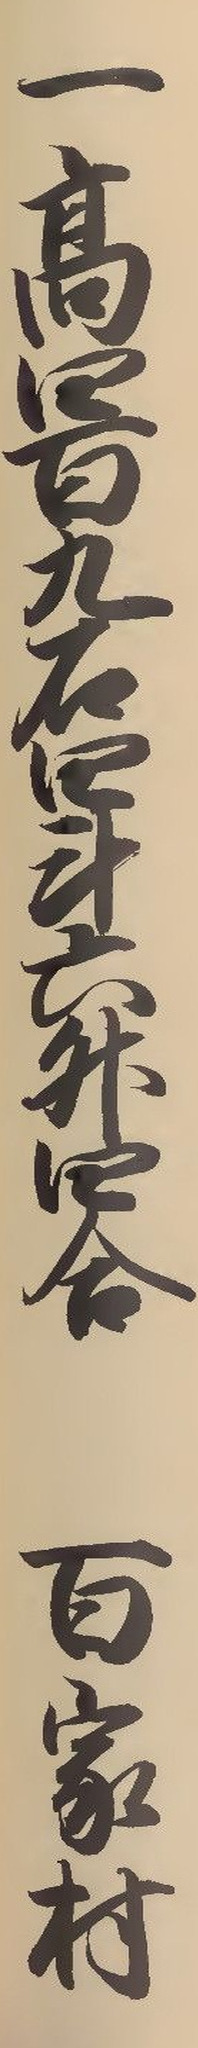一高四百九石四斗六升四合百家村
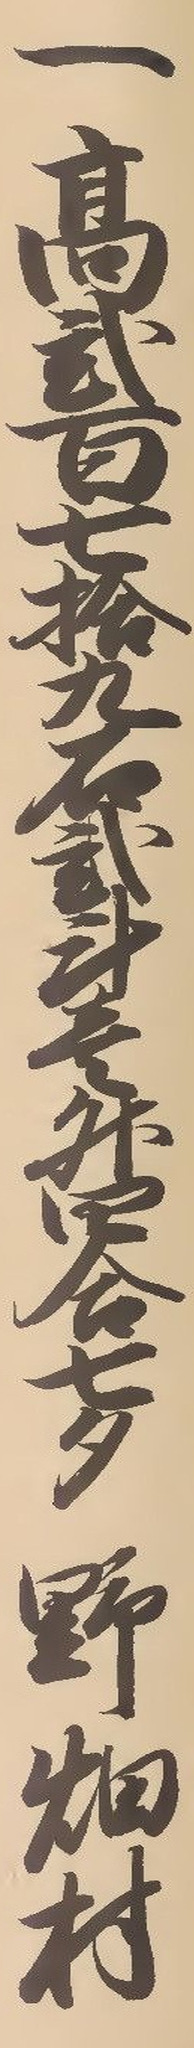一高弐百七拾九石弐斗壱升四合七勺野畑村
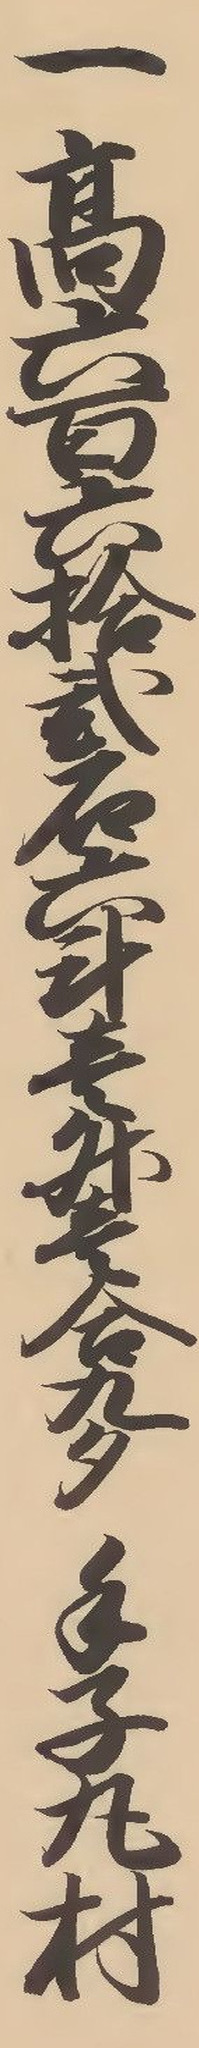一高六百六拾弐石六斗壱升壱合九勺手子丸村
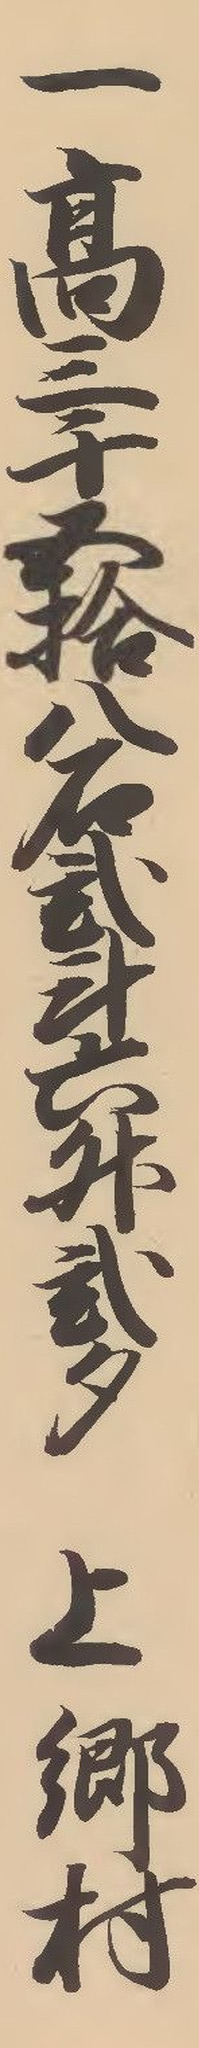一高三千五拾八石弐斗六升弐勺上郷村
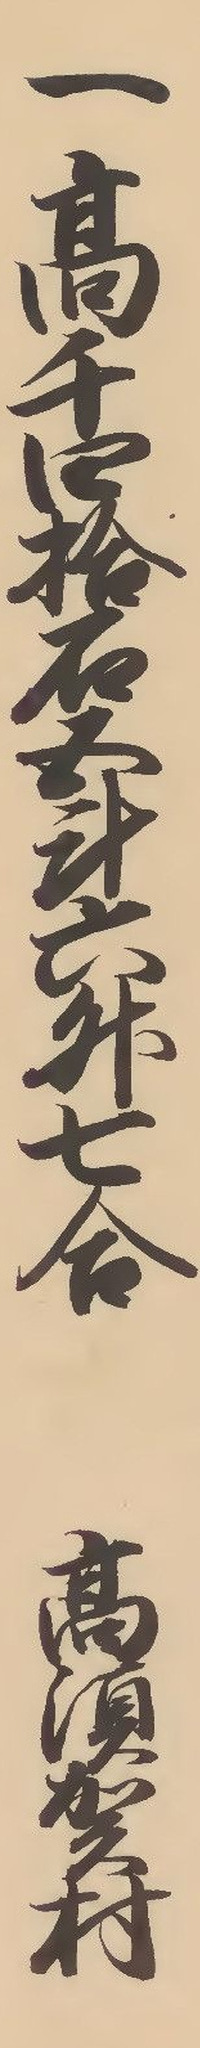一高千四拾石五斗六升七合高須賀村

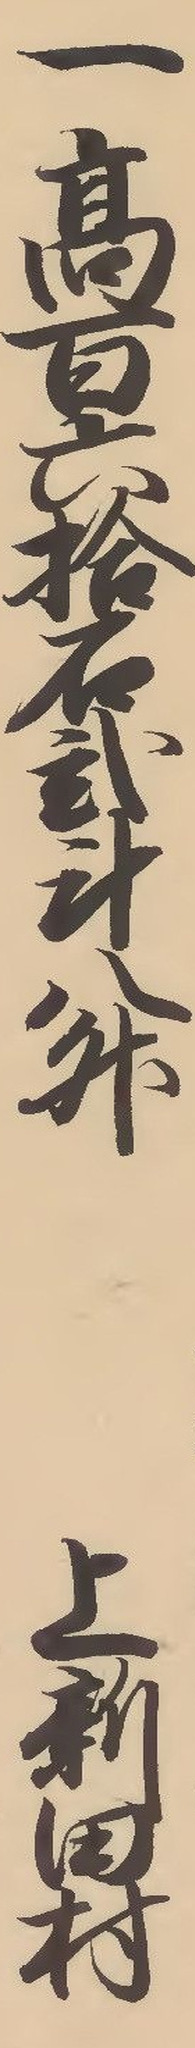一高百六拾石弐斗八升上新田村
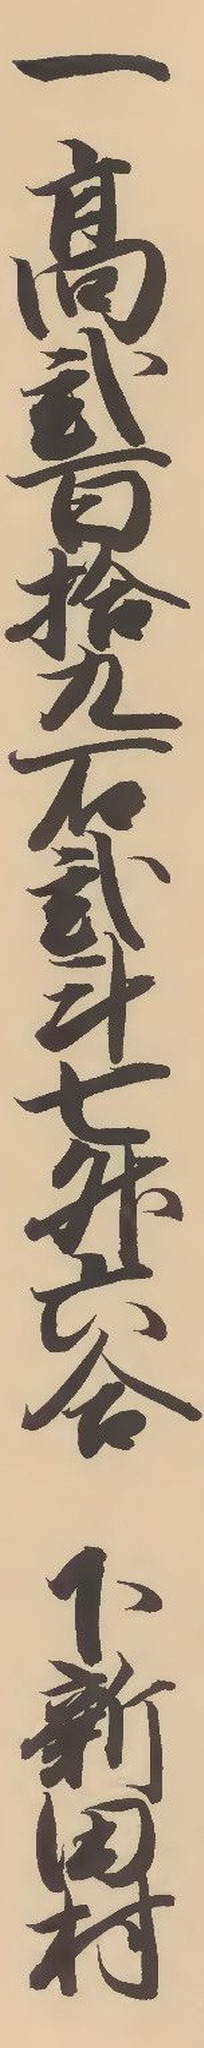一高弐百拾九石弐斗七升六合下新田村
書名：常陸国郷帳
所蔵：国立公文書館 National Archives of Japan
